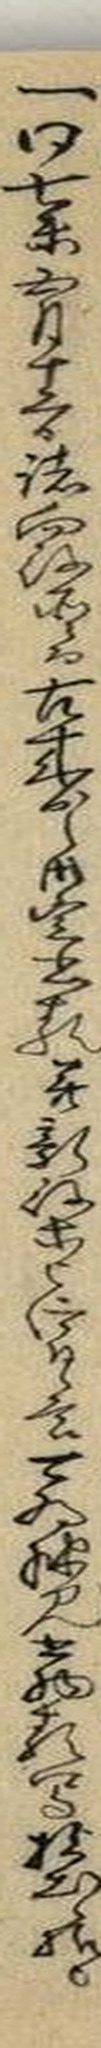一同七未五月十二日諸向役所にて古来ゟ之御定書類并新役等被仰付候節可為披見書物類写指出候様被
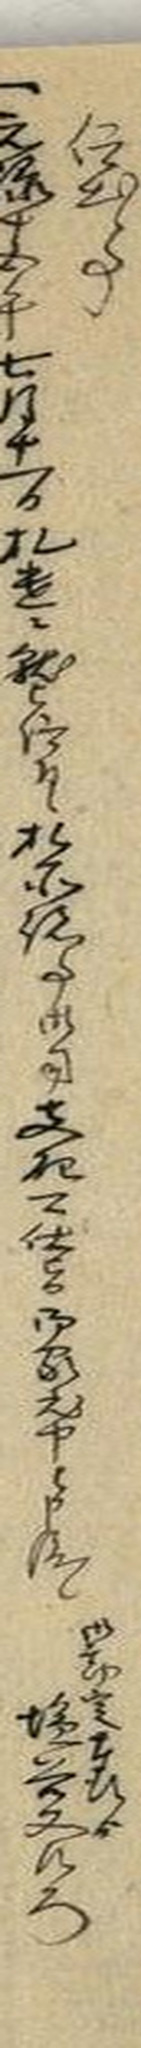一元禄十五午七月十一日札遣に就被仰付候札所諸事御用支配可仕旨御家老中被申渡候御勘定奉行ゟ塩谷又左衛門
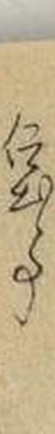仰出候事
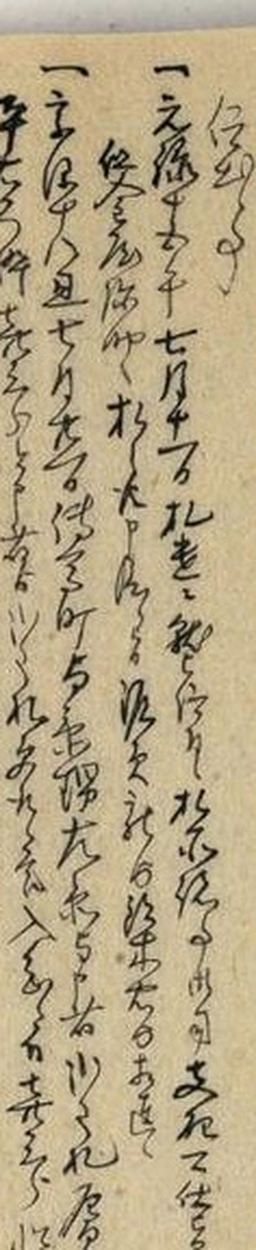但金屋弥助へ札之儀申渡候旨渥美新右衛門鈴木忠右衛門相達候
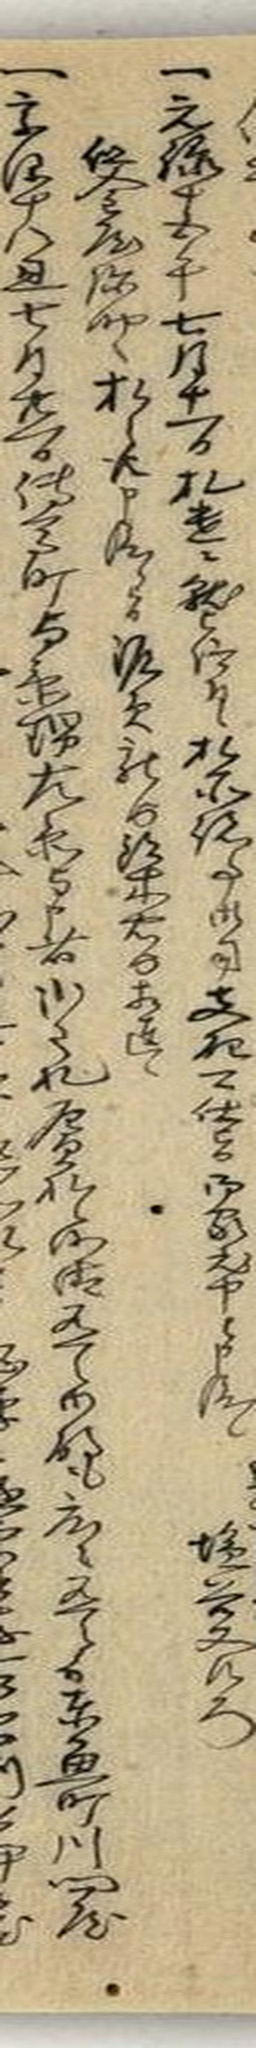一享保十八丑七月廿一日伝馬町与兵衛甥左兵衛と申者弐匁札贋札之沙汰有之御触も度々有之に付東魚町川問屋
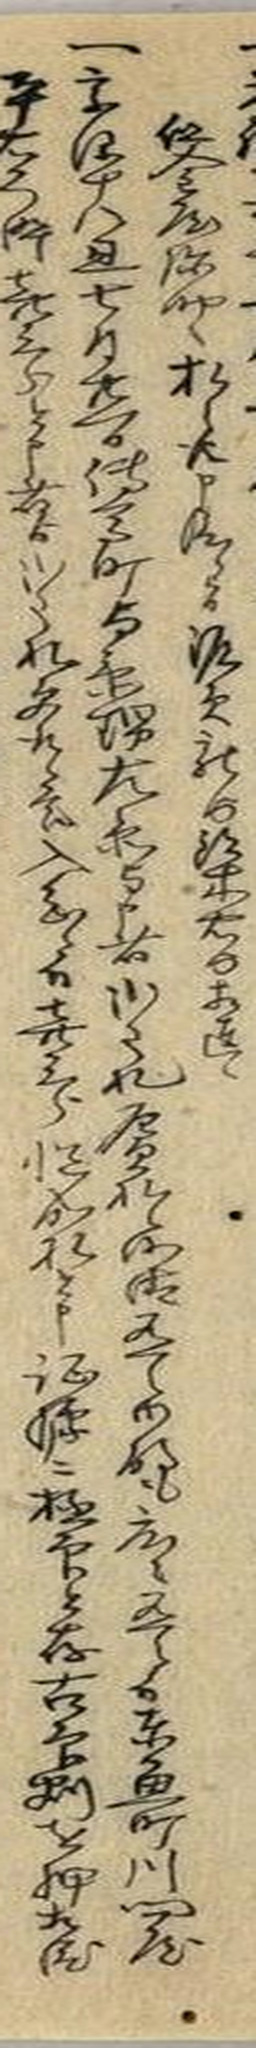平右衛門悴喜三郎と申者ゟ弐匁札受取候節入念候に付喜三郎慥成札と申証拠に極印と存古印判を押相渡
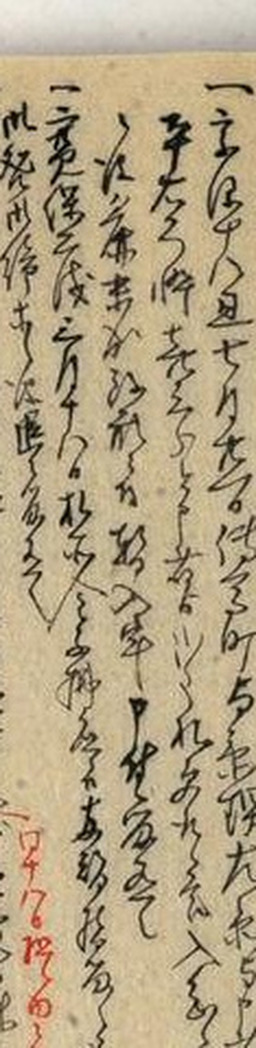候儀麁末成致形に付暫入牢申付候留有之
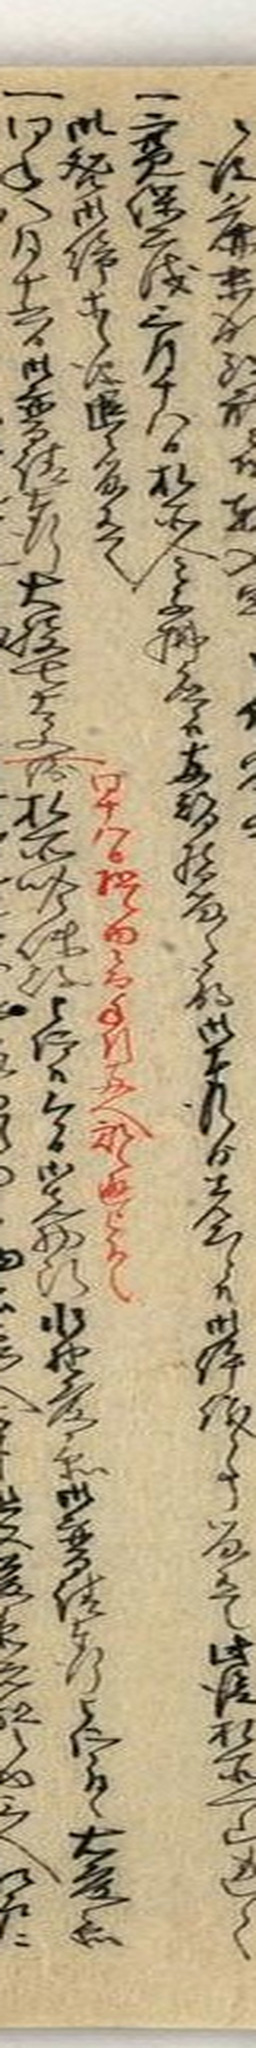一同年八月十六日御普請奉行大崎七大夫儀札所吟味役被仰付今日御先物頭水野藤兵衛御普請奉行被仰付候右藤兵衛
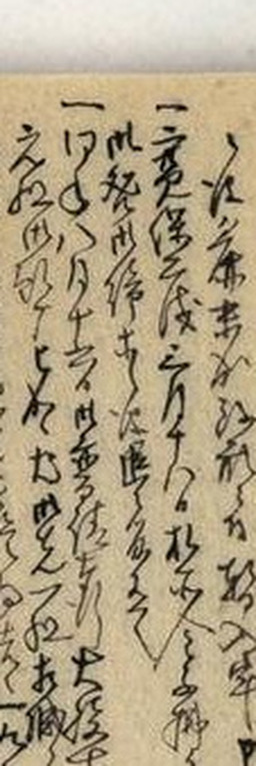御咎御締等之儀追々留有之
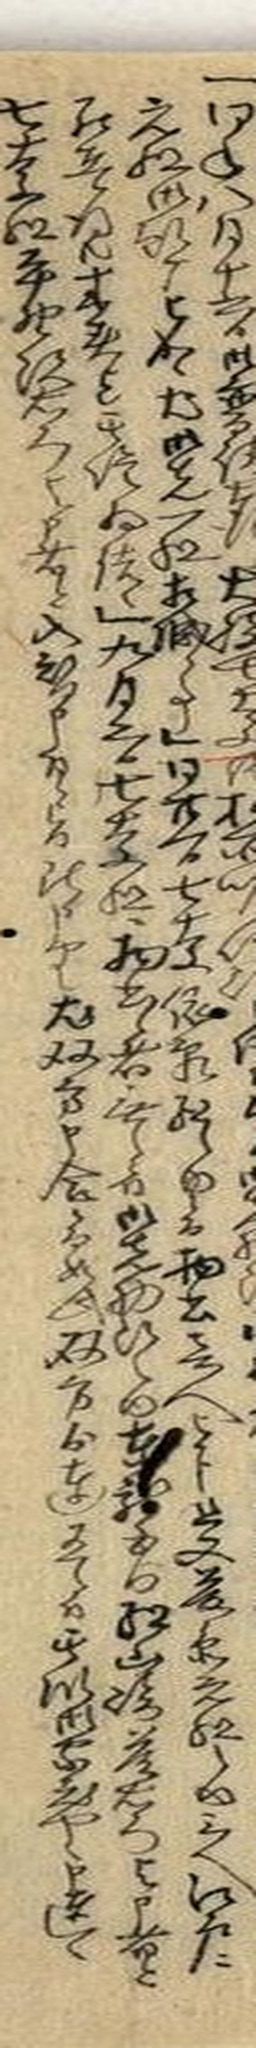七大夫組平野沢右衛門と申者と入替申付候旨被申聞候尤双方申合候て如此双方ゟ達有之に付其段御家老中へ申達候

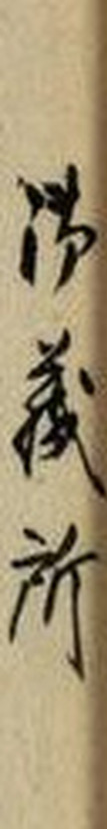御蔵所
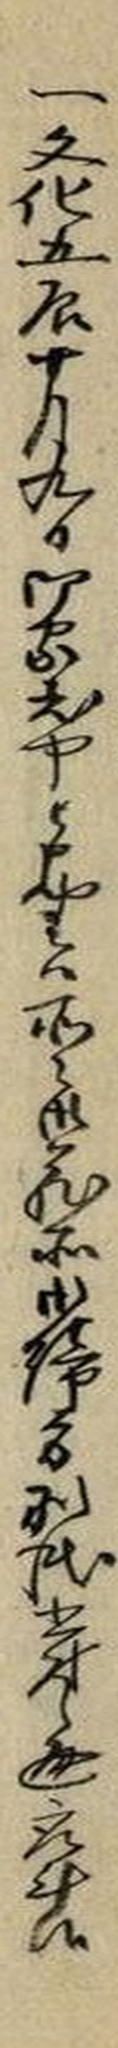一文化五辰十月九日御家老中被申聞候は所々御蔵所御締方別紙書付之通取斗候
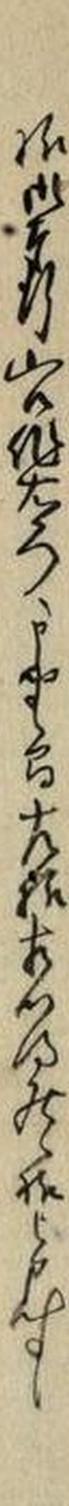様御奉行山口作右衛門へ申聞候間左様相心得居候様被申聞候
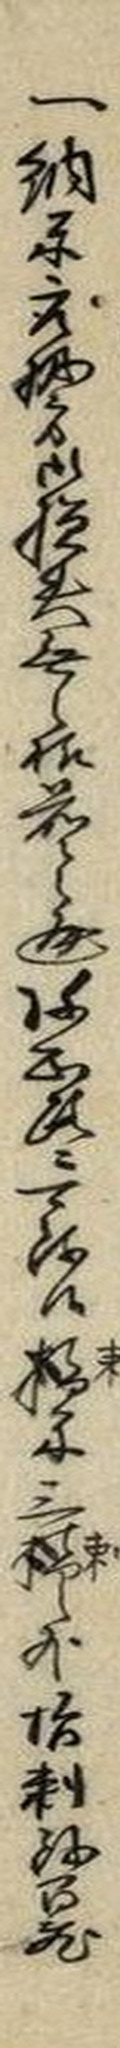一納米取扱方御損失無之様前々之通弥正路に可致候指米三指之外増刺致間敷
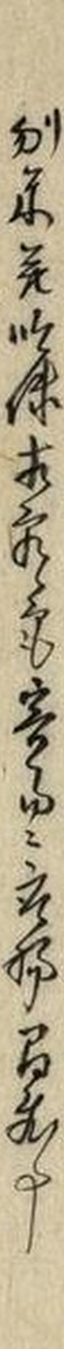刎米并吟味相願候ても容易に取揚間敷事
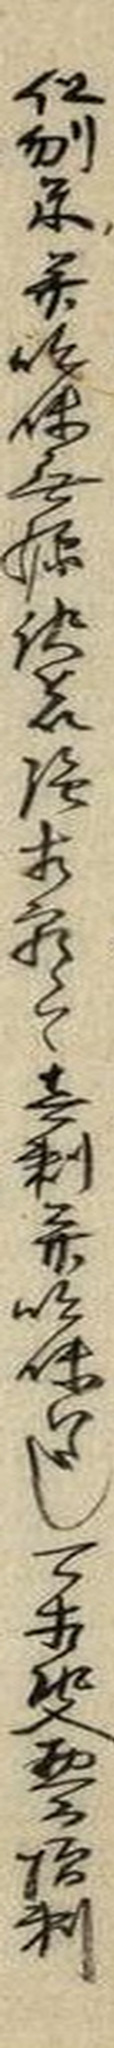但刎米并吟味無拠訳を以強相願候はゝ壱刺并吟味いたし可相決惣て増刺
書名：御城下諸事之部
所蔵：福井県文書館 Fukui Prefectural Archives
